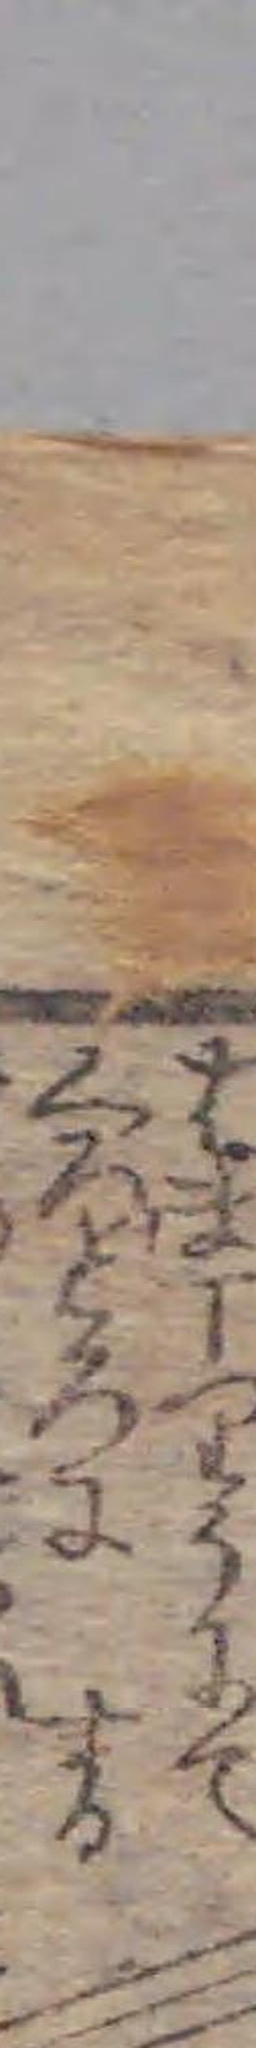くろとろにする
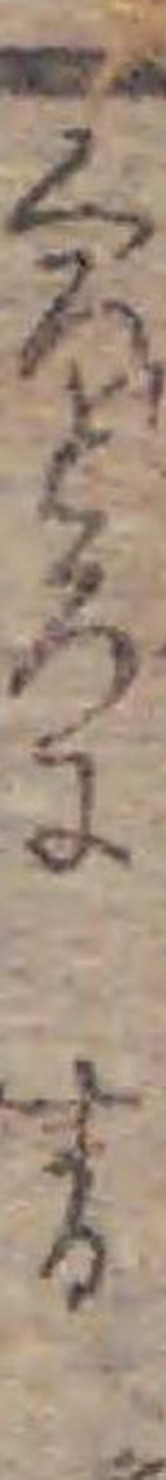くろとろにする
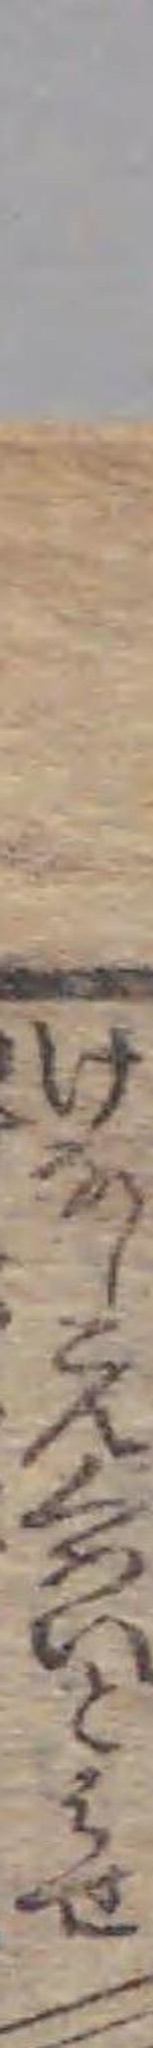けふしこんくはいとみせ
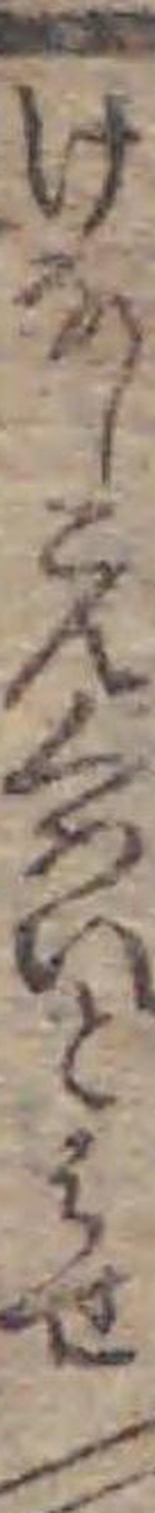けふしこんくはいとみせ
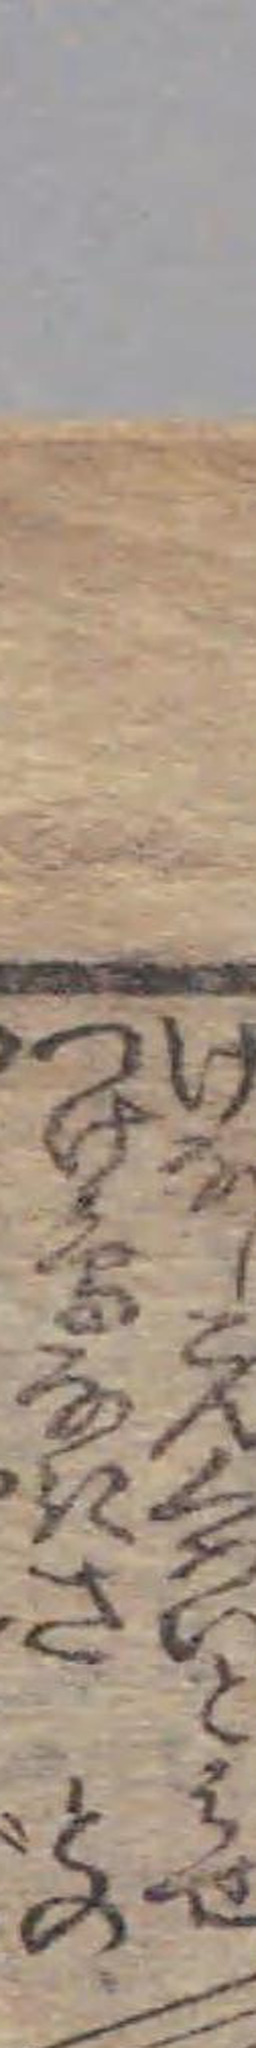つけ鳥なきさとの
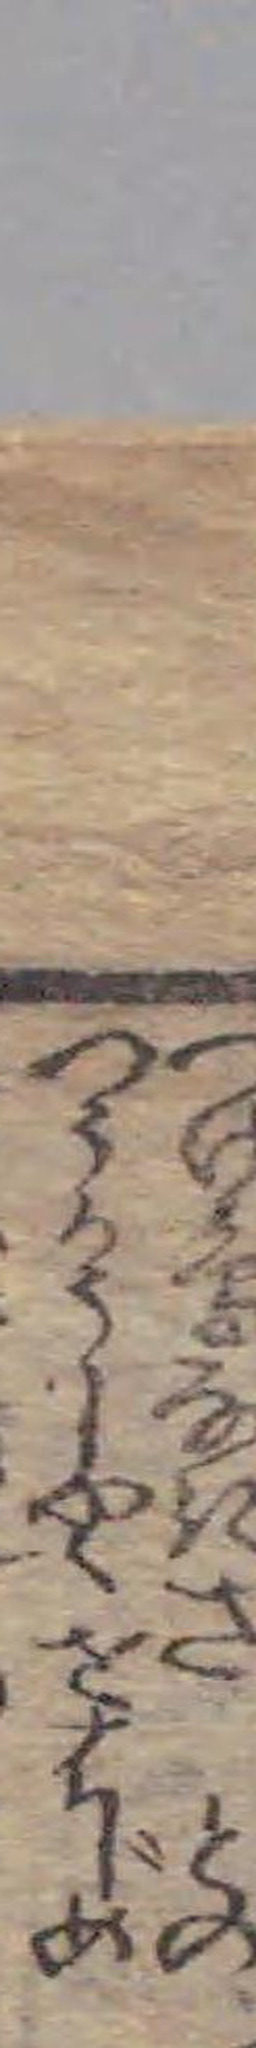つうかうしやくをはじめ
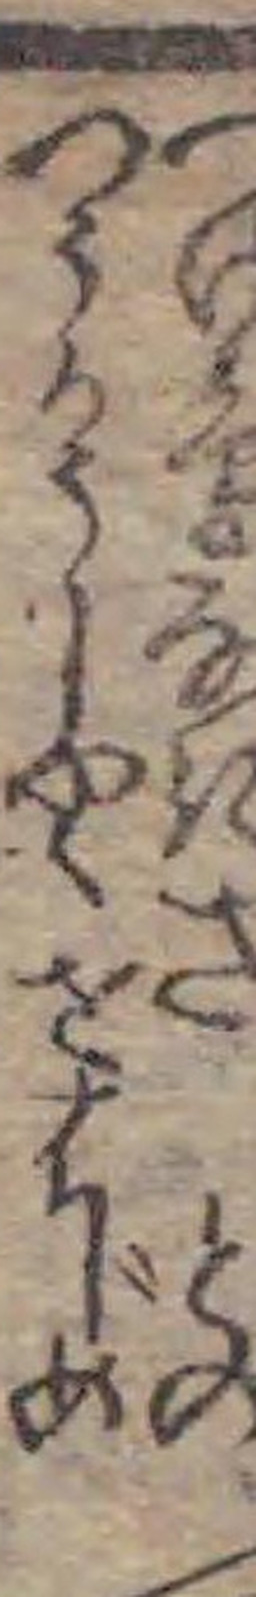つうかうしやくをはじめ
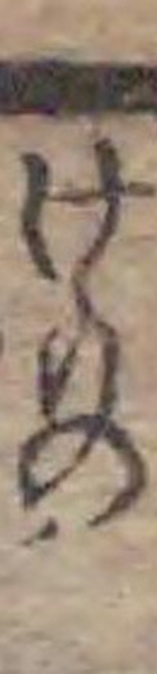けもの
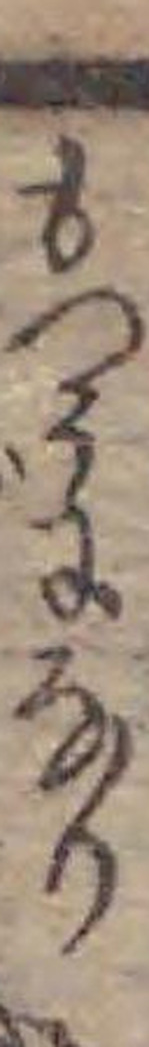もつうになり
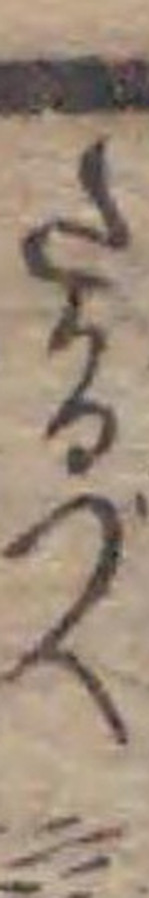たかるべく
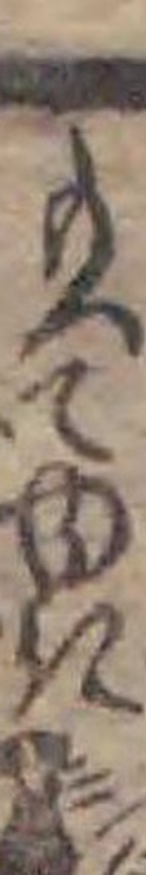もつてゆき
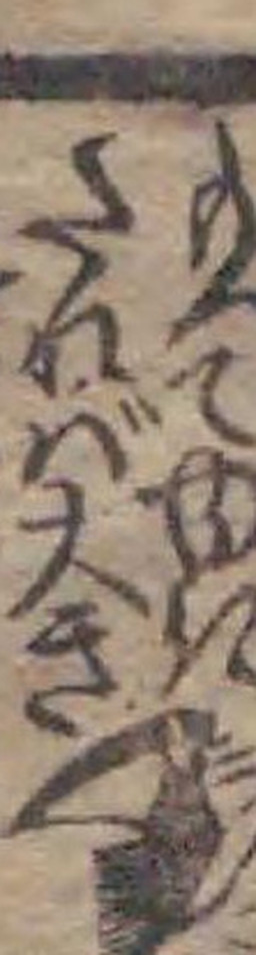たれば大き
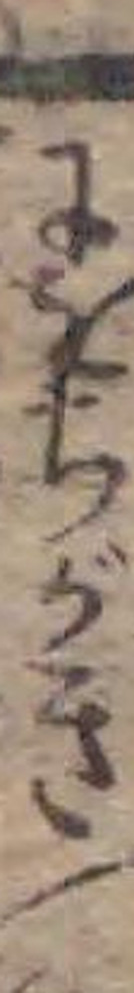にをちがき
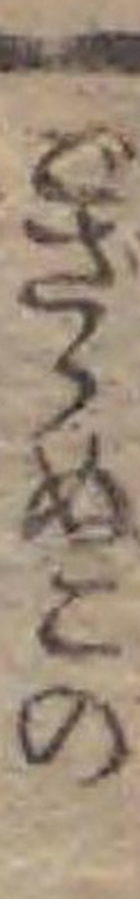ござらぬこの
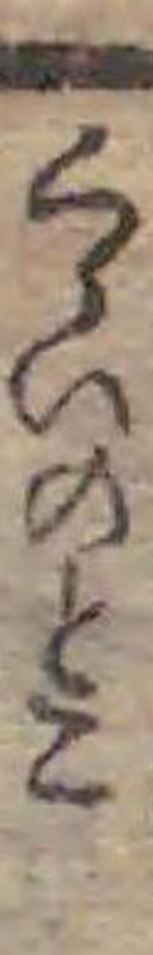くらいのとこ
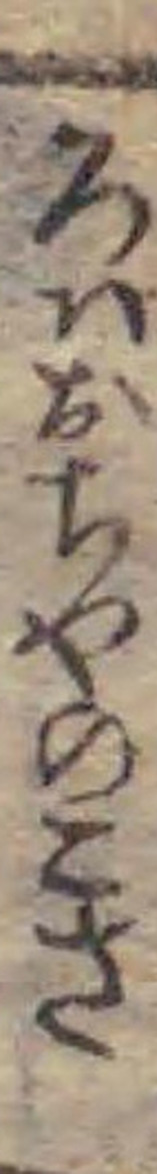ろはおちやのこさ
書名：化物楽屋異牒 : 2巻
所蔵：国立国会図書館 National Diet Library, JAPAN
